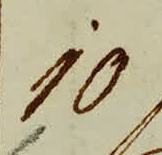10
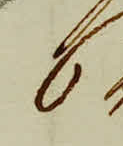6
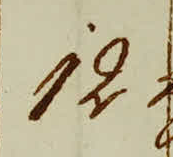12
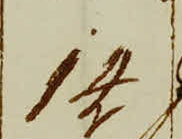14
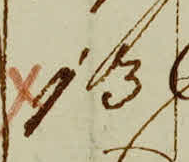13
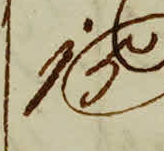15
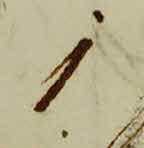1
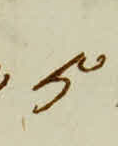5
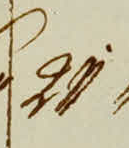21
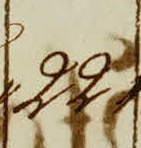22
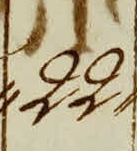22
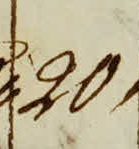20
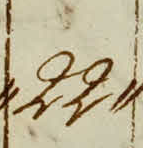22
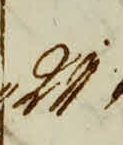21
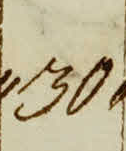30
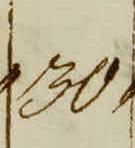30
